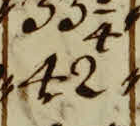42
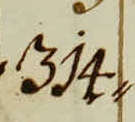314
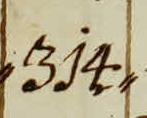314
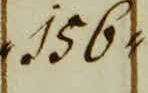156
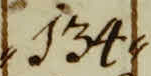134
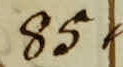85
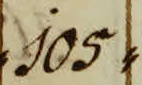105
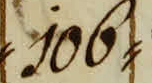106
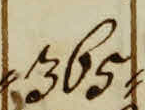365
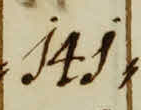141
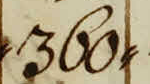360
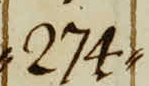274
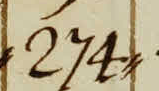274
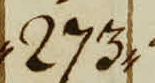273
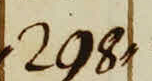298
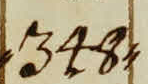348
